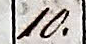10.
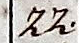22.
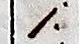1.
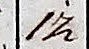12
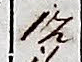12
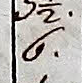6.
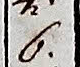6.
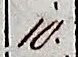10.
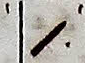1
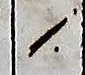1.
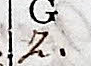2.
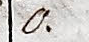0.
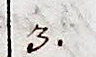3.
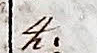4.
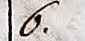6
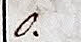0.
